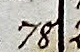78
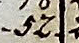52
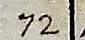72
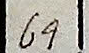69
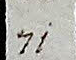71
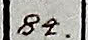84
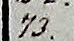73
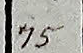75
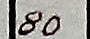80
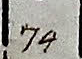74
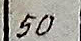50
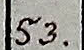53
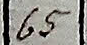65
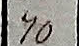70
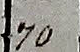70
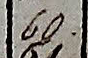60
